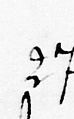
s¬
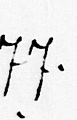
f¬
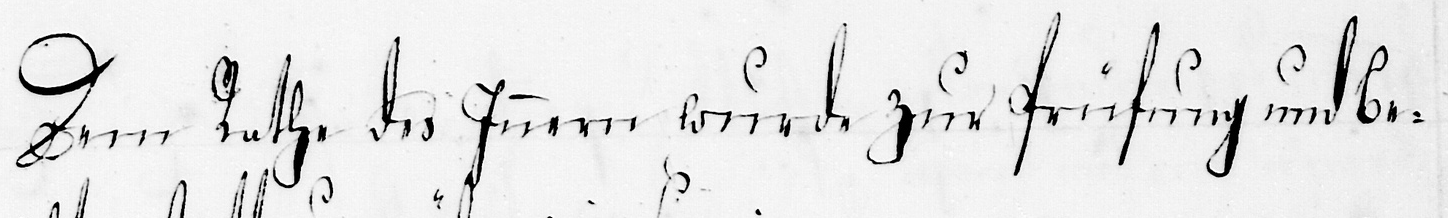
Dem Rathe des Innern wurde zur Prüfung und Be¬
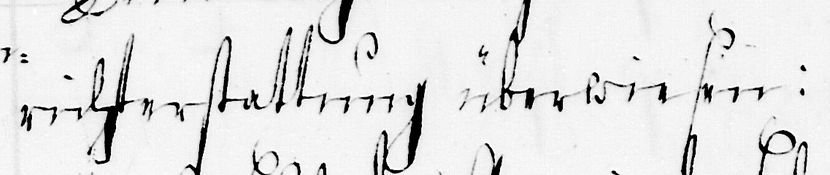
richterstattung überwiesen:
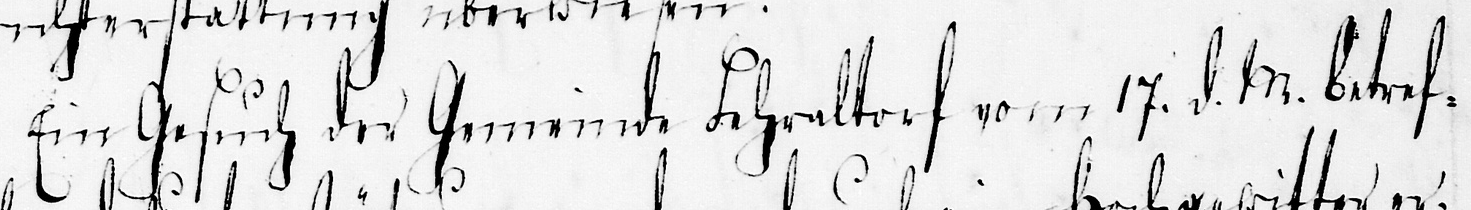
Ein Gesuch der Gemeinde Fehraltorf vom 17. d. M. betre¬
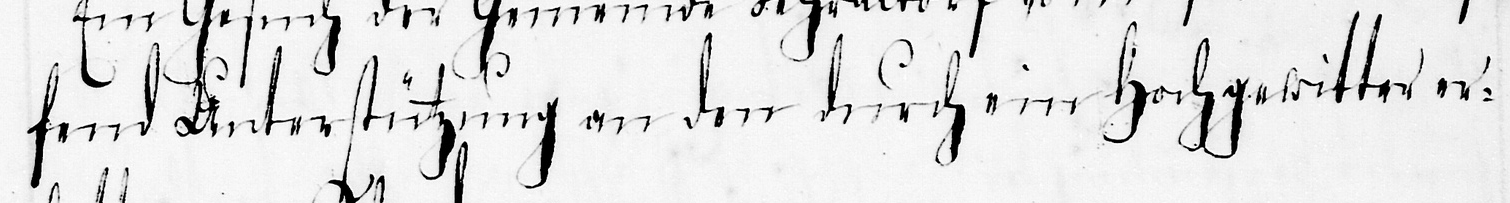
fend Unterstützung an den durch ein Hochgewitter er¬
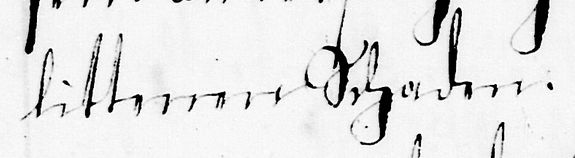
littenen Schaden.
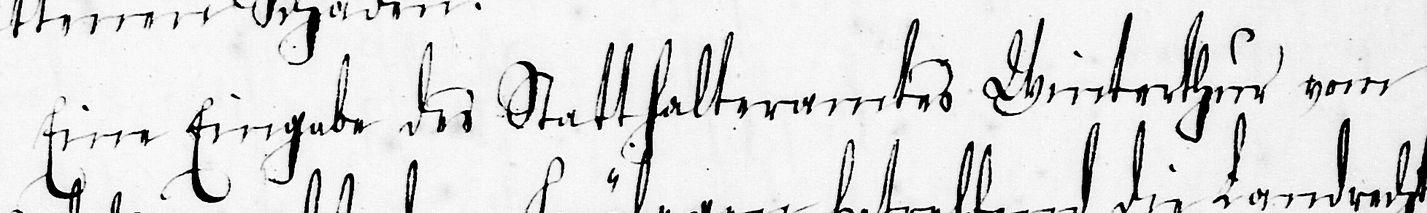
Eine Eingabe des Statthalteramtes Winterthur vom
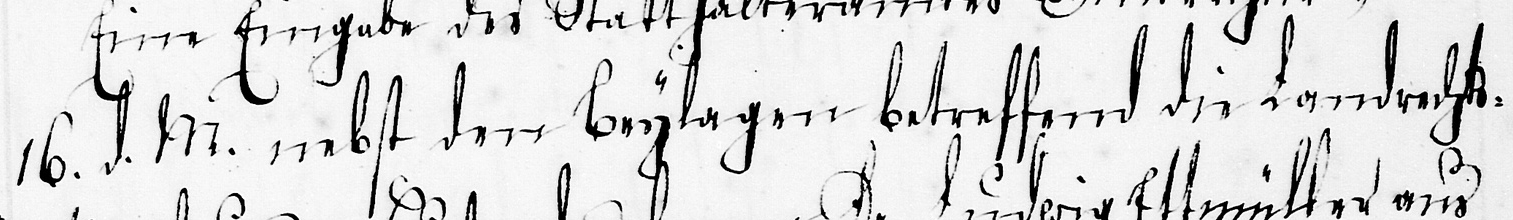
16. d. M. nebst den Beylagen betreffend die Landrecht¬
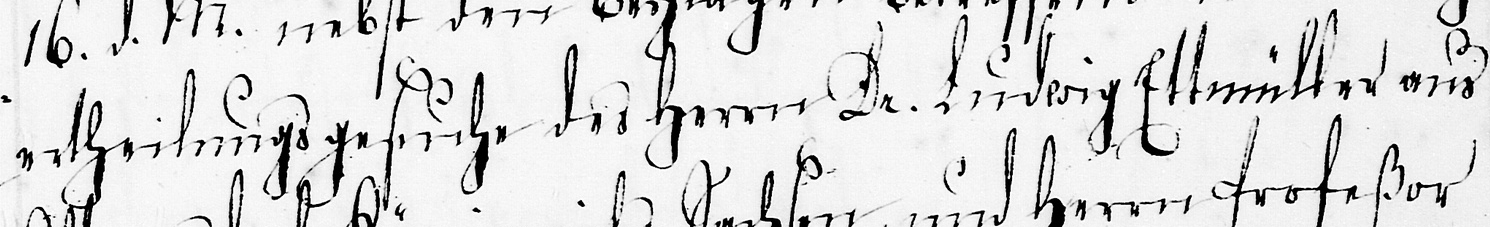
ertheilungsgesuche des Herrn Dr. Ludwig Ettmüller aus
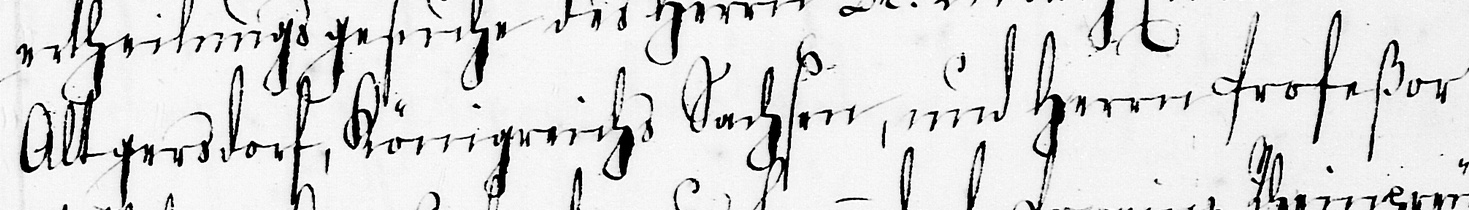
Altgersdorf, Königreichs Sachsen, und Herrn Profeßor
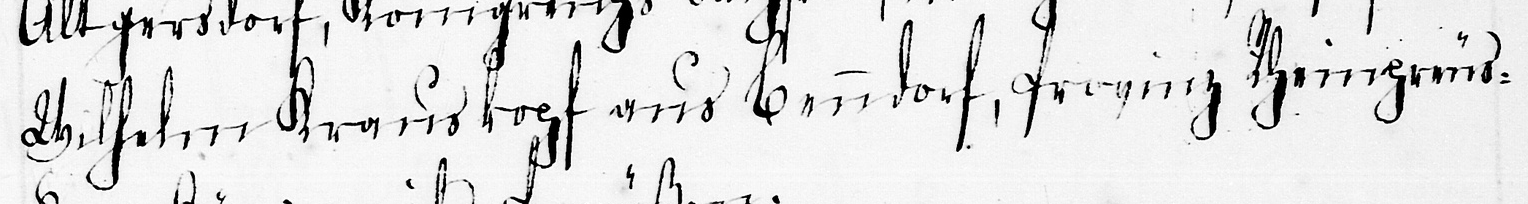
Wilhelm Krauskopf aus Benndorf, Provinz Rheinpreuß¬
